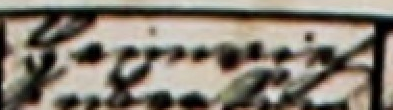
Heimvieh
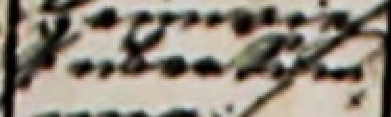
über S???
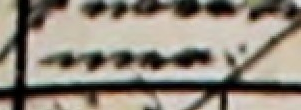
mer.
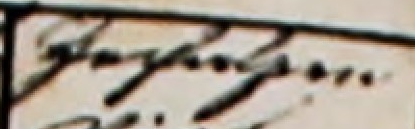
Zechalgen
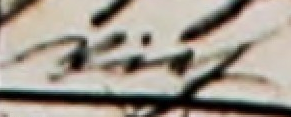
Vieh
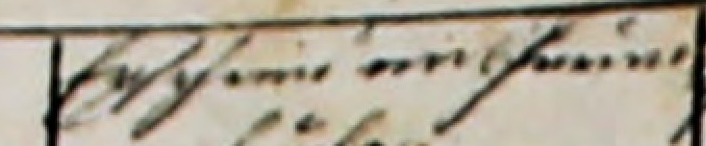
Erscheint im Grund„
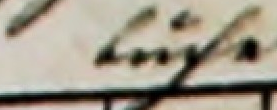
buche
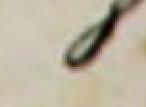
8
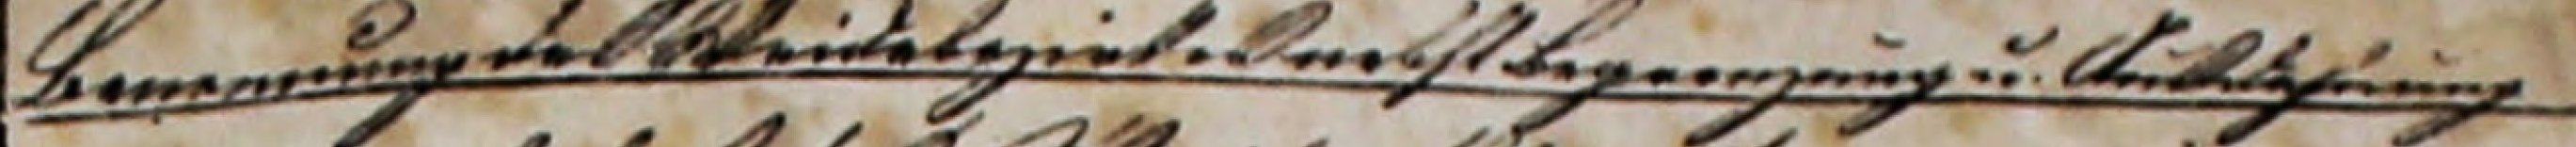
Benennung des Weidabezirkes nebst Begrenzung u. Ausdehnung
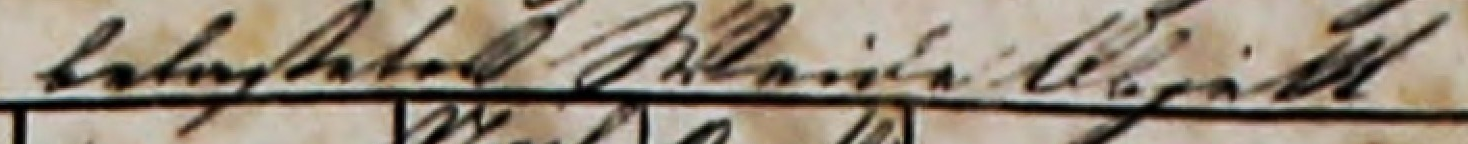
belaßetes Weide Objekt
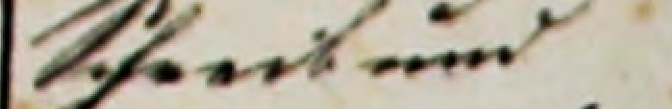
Schreib und
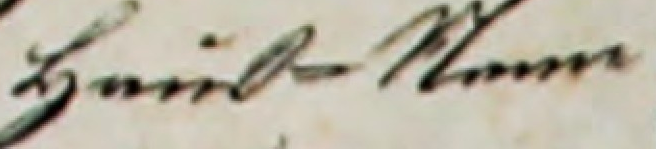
Haus=Name
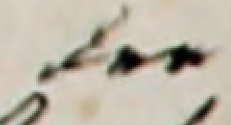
der
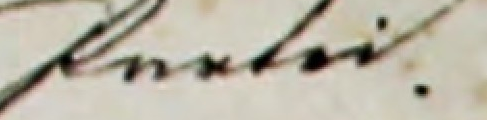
Partei
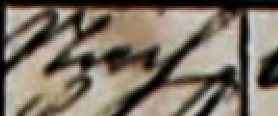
Nach
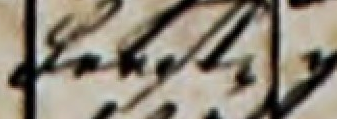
Seest„
